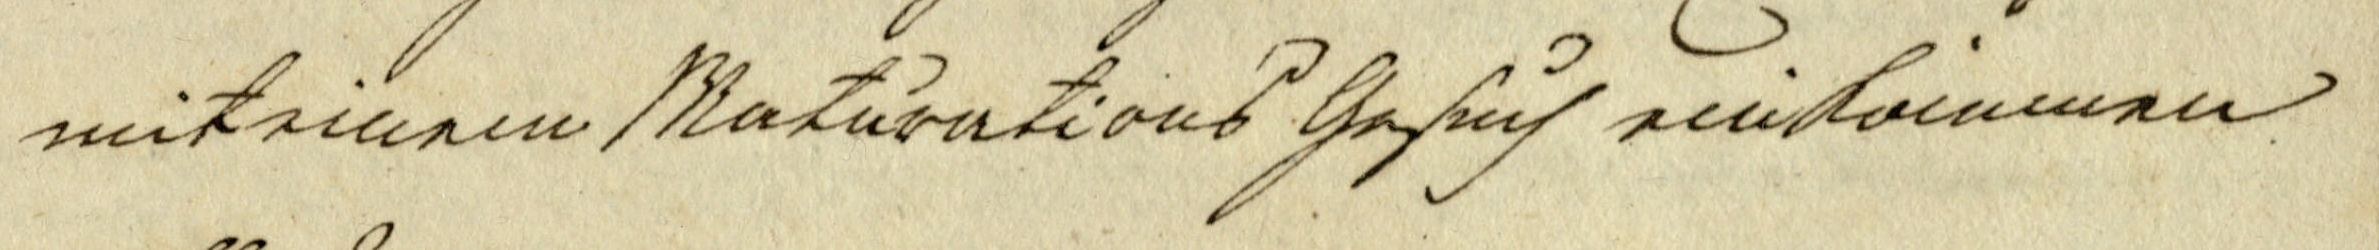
mit einem Maturations Gesuch einkommen
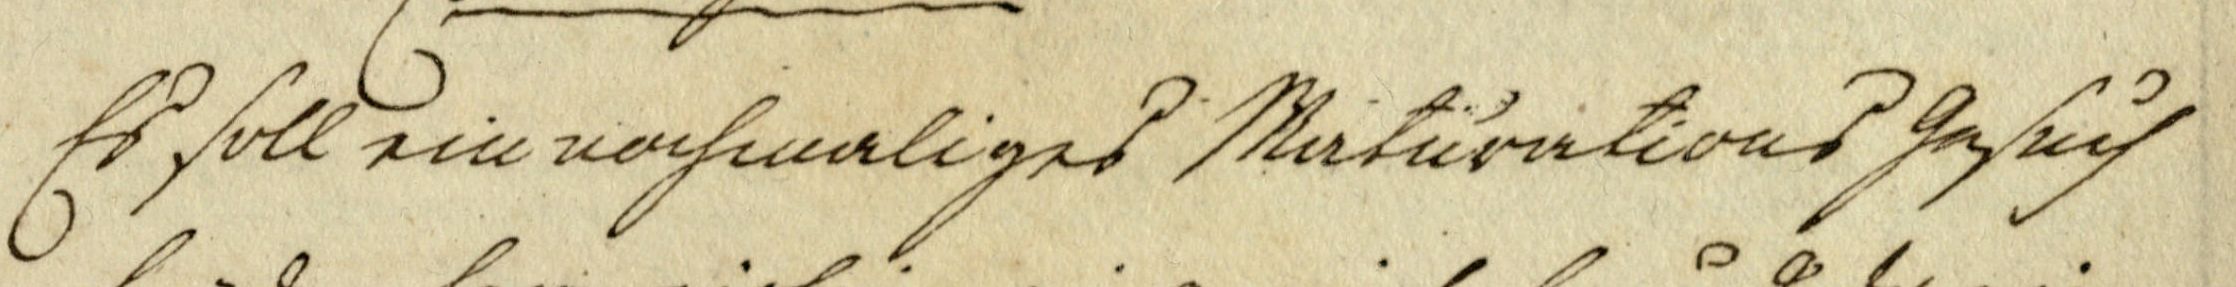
Es soll ein nochmaliges Maturations Gesuch
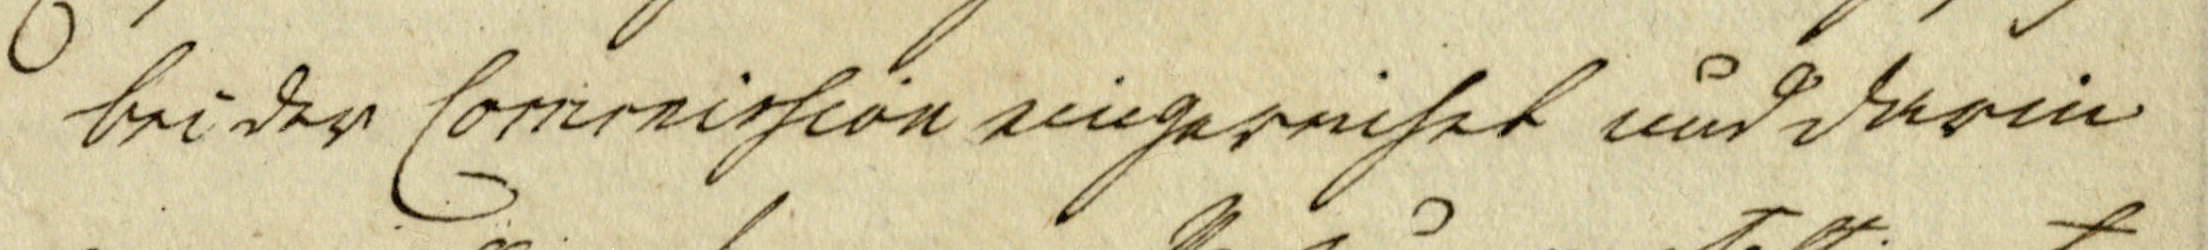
bei der Commission eingereichet und darin
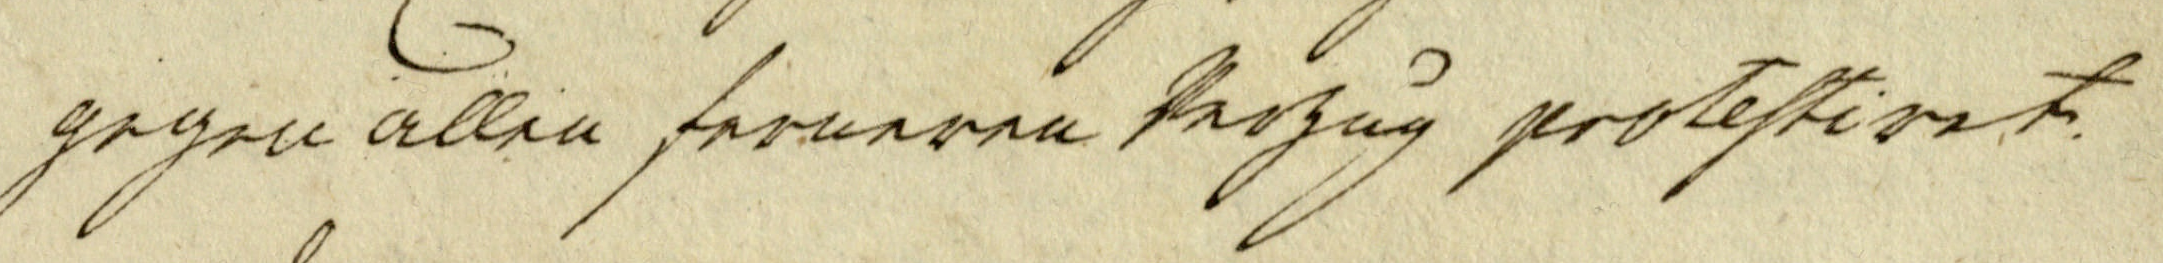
gegen allen ferneren Verzug protestiret
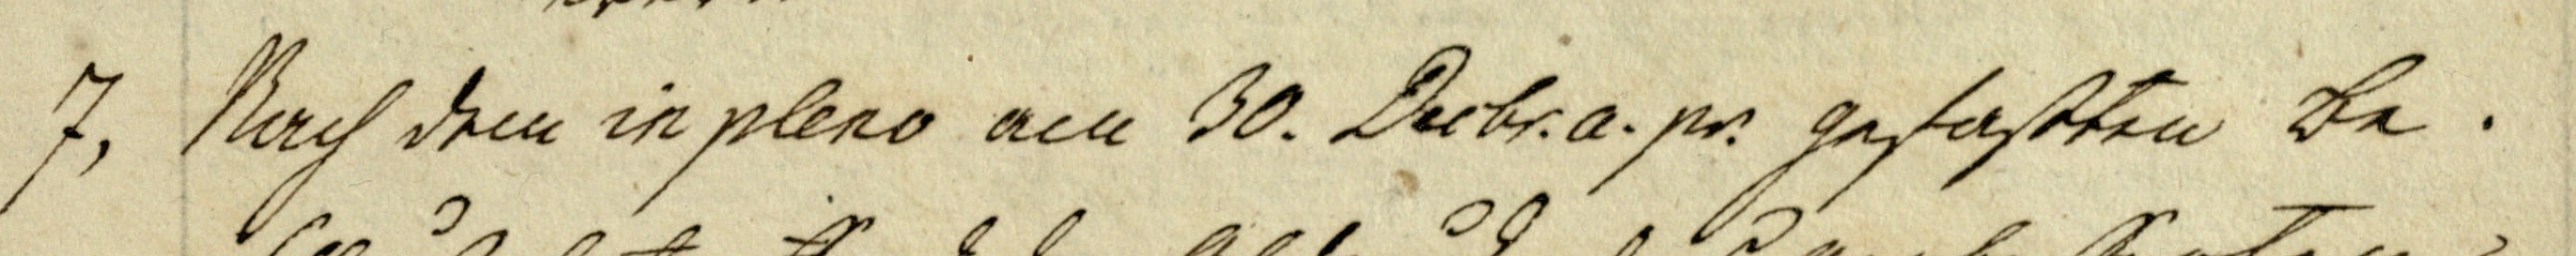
7., Nach dem in pleno am 30. Decbr a. pr. gefaßten Be¬
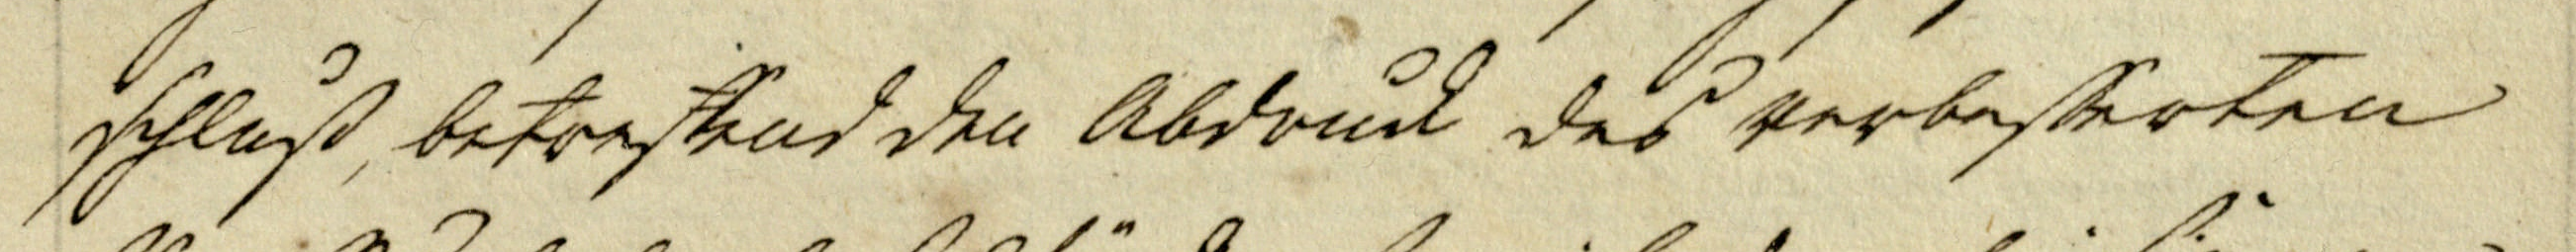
schluß, betreffend den Abdruck des verbesserten
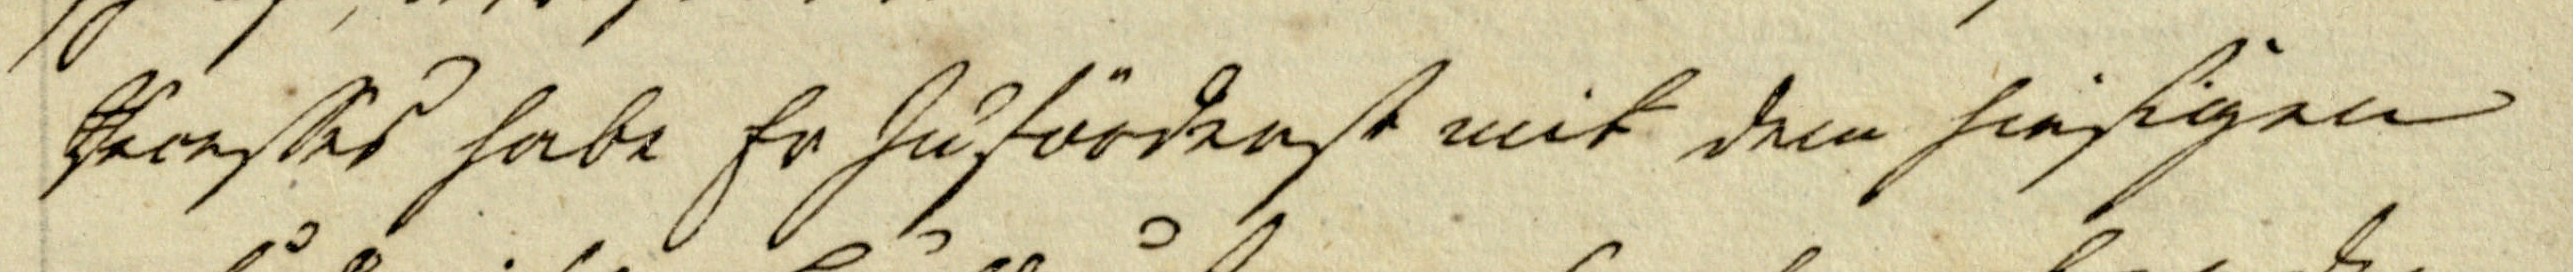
Recesses habe Er zuförderst mit dem hiesigen
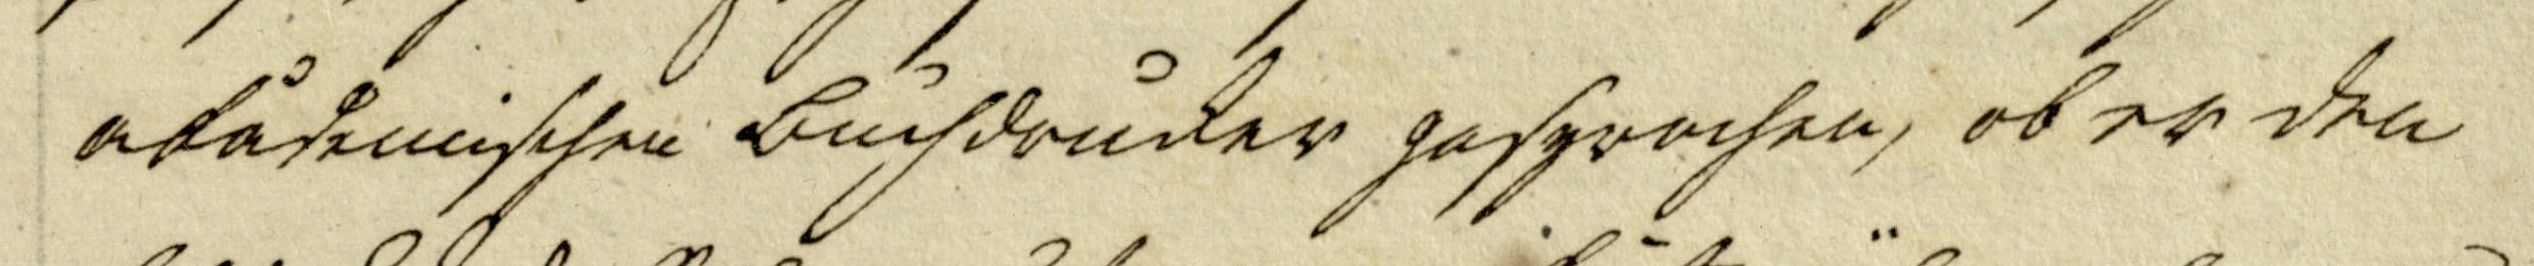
akademischen Buchdrucker gesprochen, ob er den
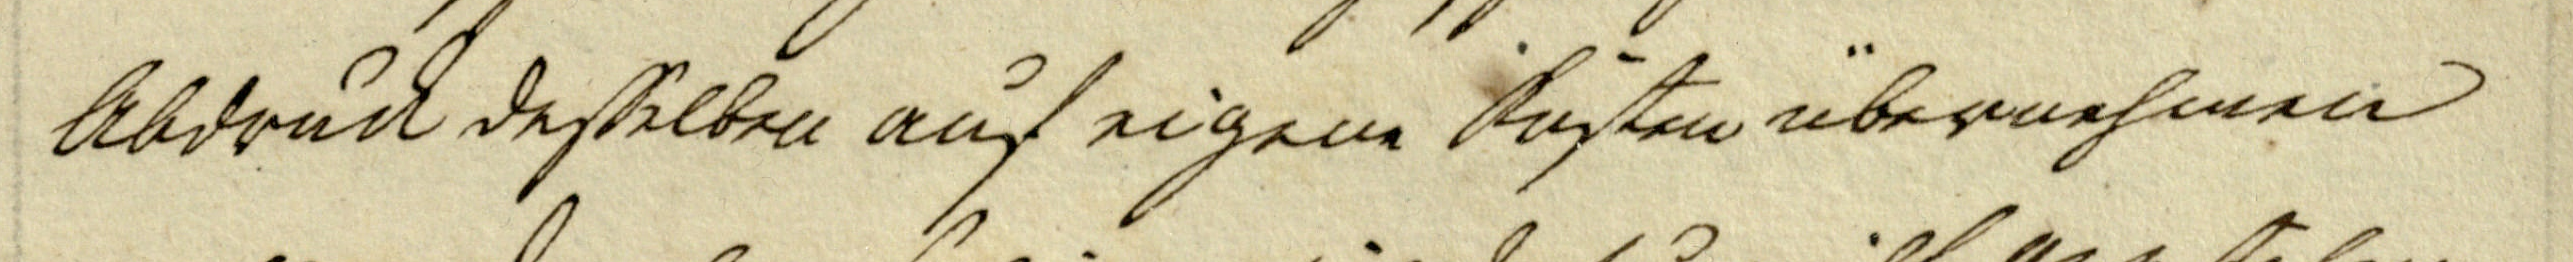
Abdruck desselben auf eigene Kosten übernehmen
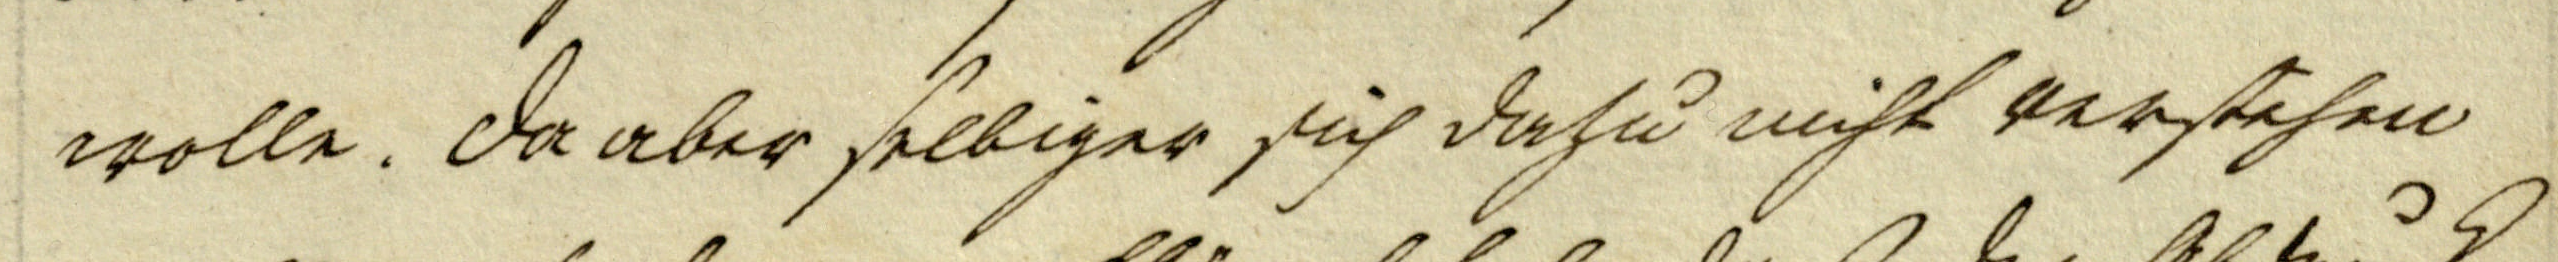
wolle. Da aber selbiger sich dazu nicht verstehen
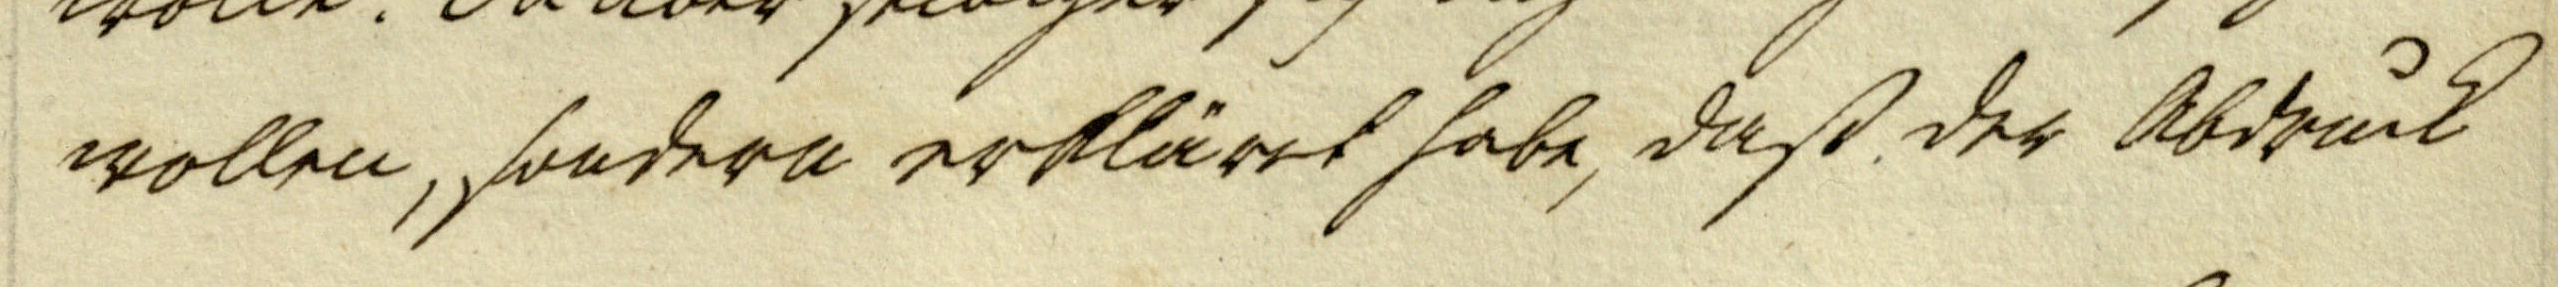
wollen, sondern erkläret habe, daß der Abdruck
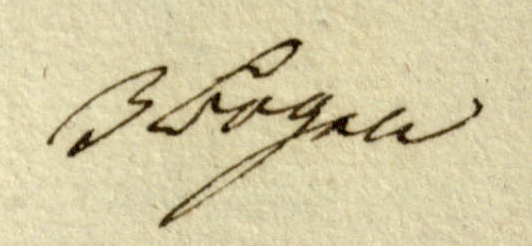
3 Bogen
